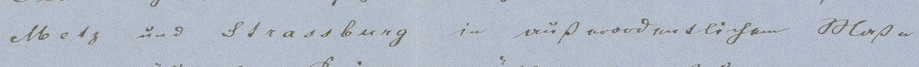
Metz und Strassburg in außerordentlichem Maße
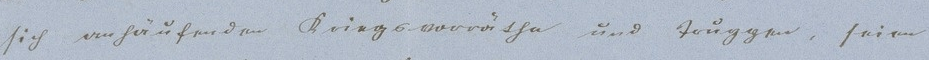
sich anhäufenden Kriegsvorräthe und Truppen, seien
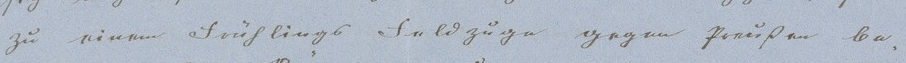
zu einem Frühlings Feldzuge gegen Preußen be-
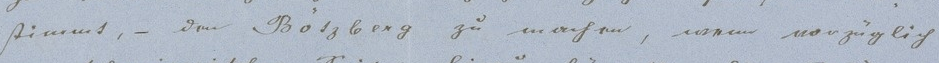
stimmt, – den Bötzberg zu machen, wenn vorzüglich
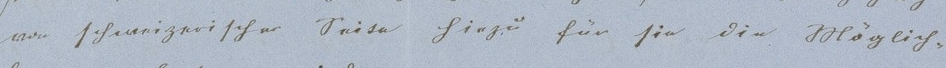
von schweizerischer Seite hiezu für sie die Möglich-
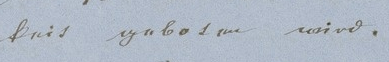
keit geboten wird.
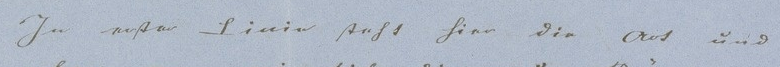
In erster Linie steht hier die Art und
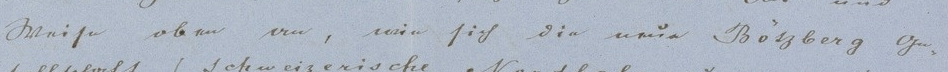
Weise oben an, wie sich die neue Bötzberg Ge-
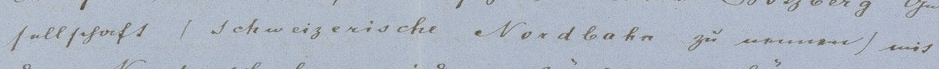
sellschaft (Schweizerische Nordbahn zu nennen) mit
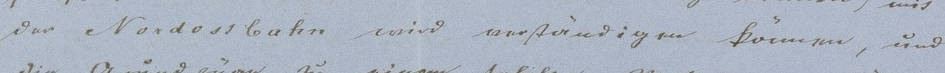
der Nordostbahn wird verständigen können, und
